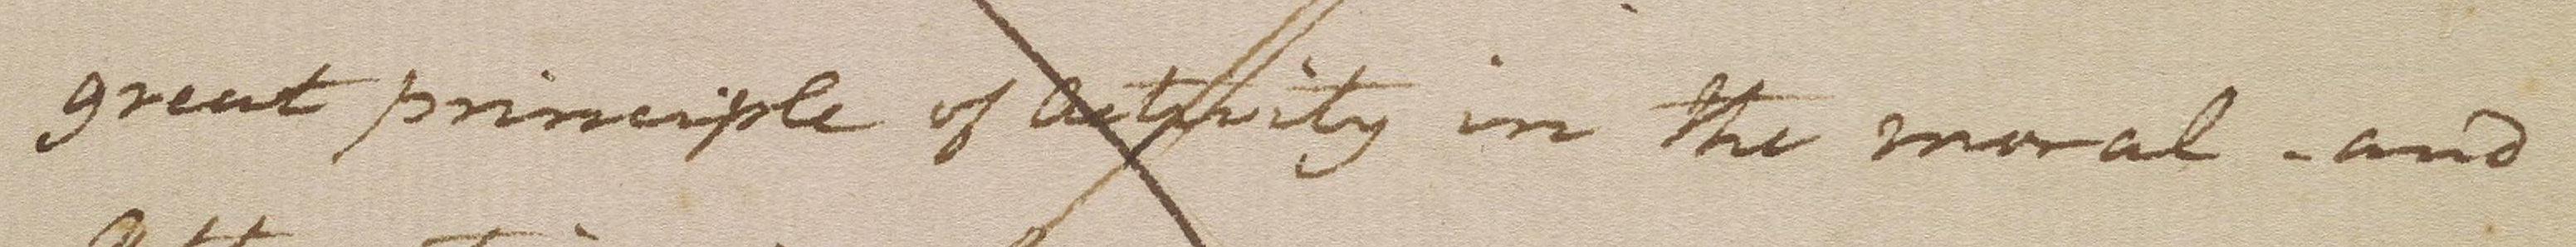the great principle of activity in the moral and
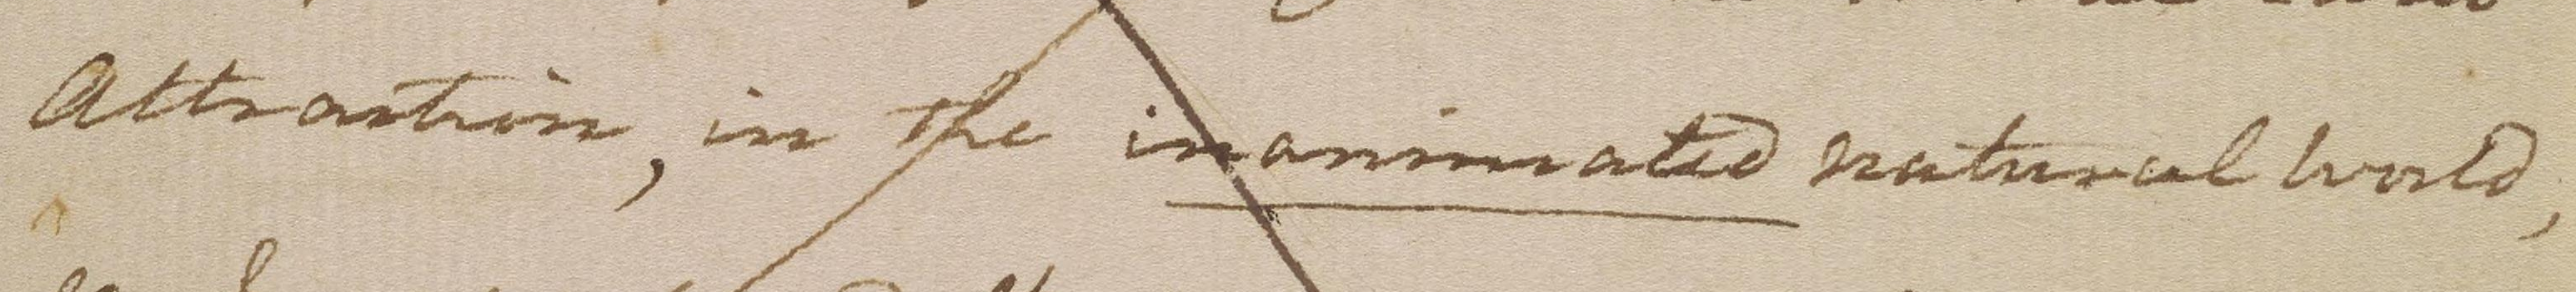attraction in the inanimated natural world
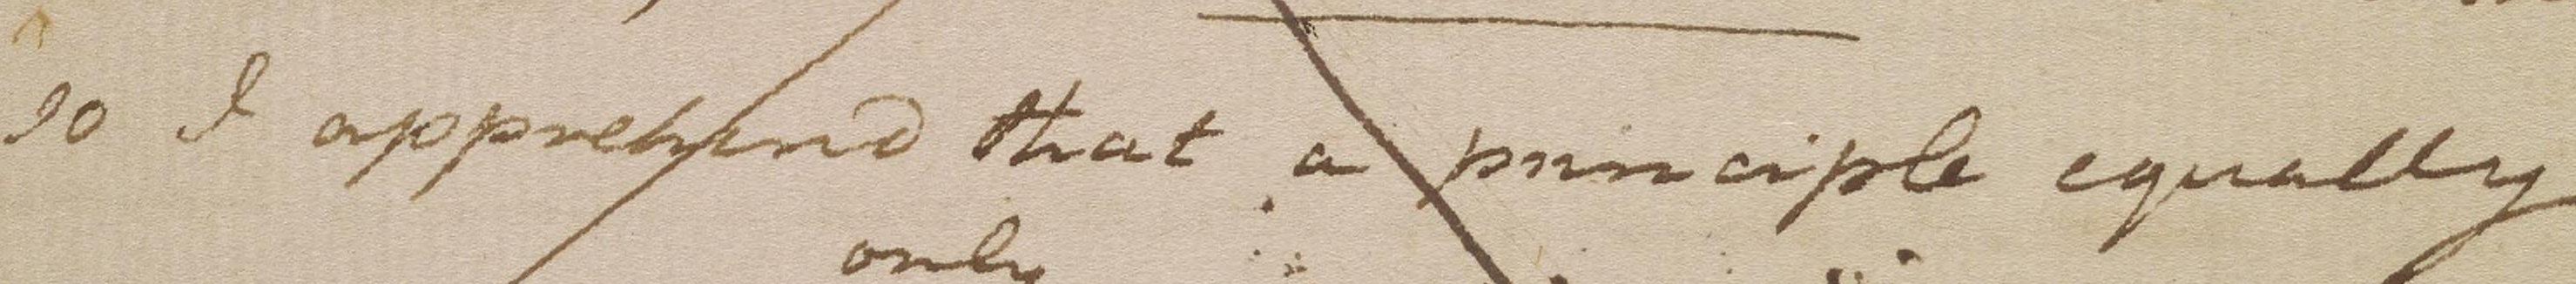so I apprehend that a principle equally
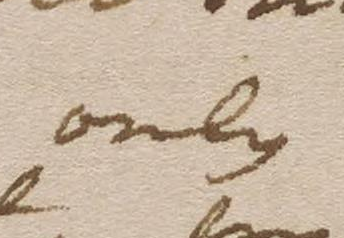only
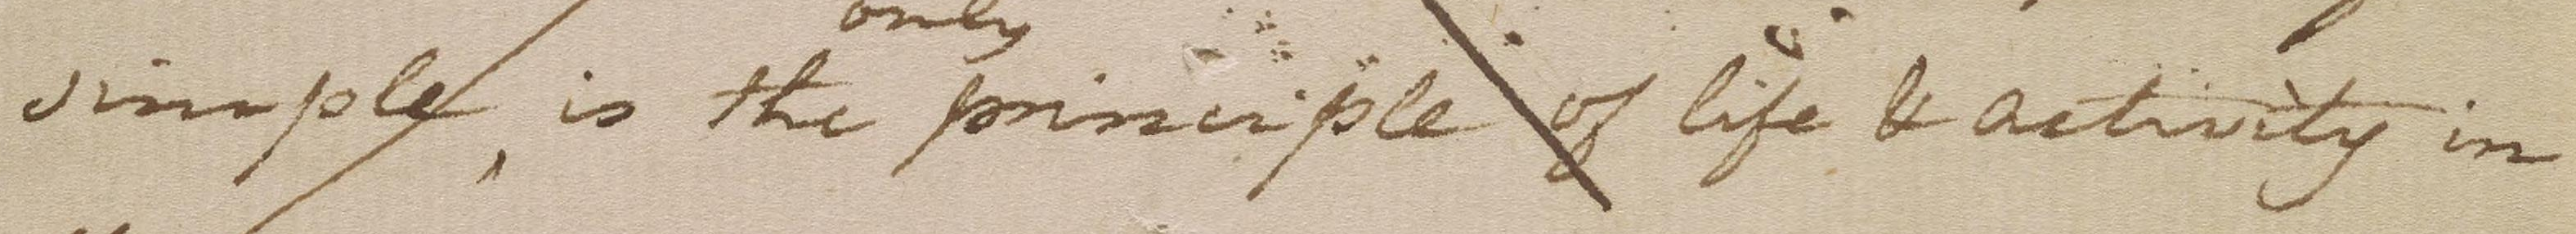simple is the ^ principle of life & activity in
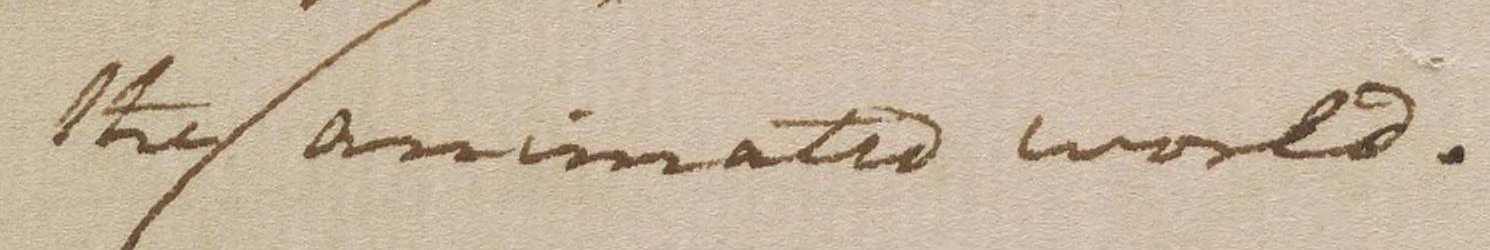the animated world.
